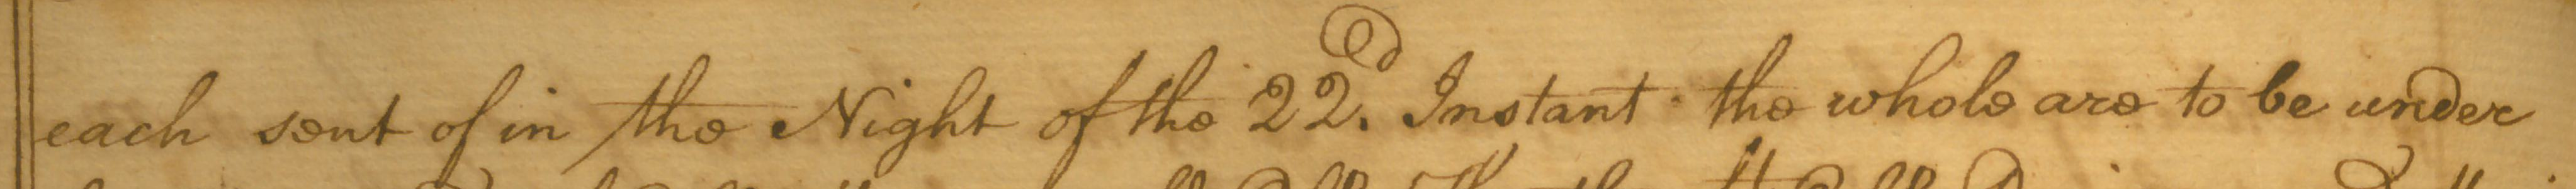each sent of in the Night of the 22^d. Instant the whole are to be under
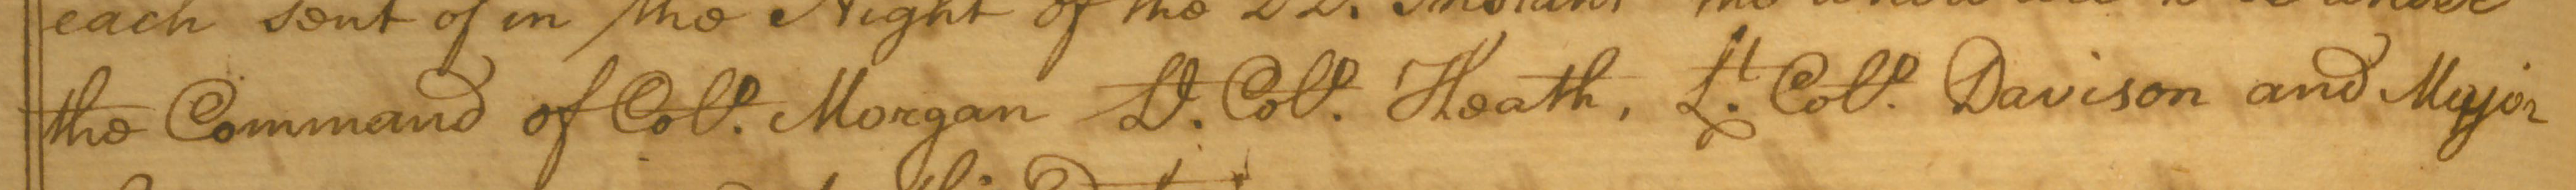the Command of Col^o. Morgan L^t. Col^o. Heath, L^t. Col^o. Davison and Major
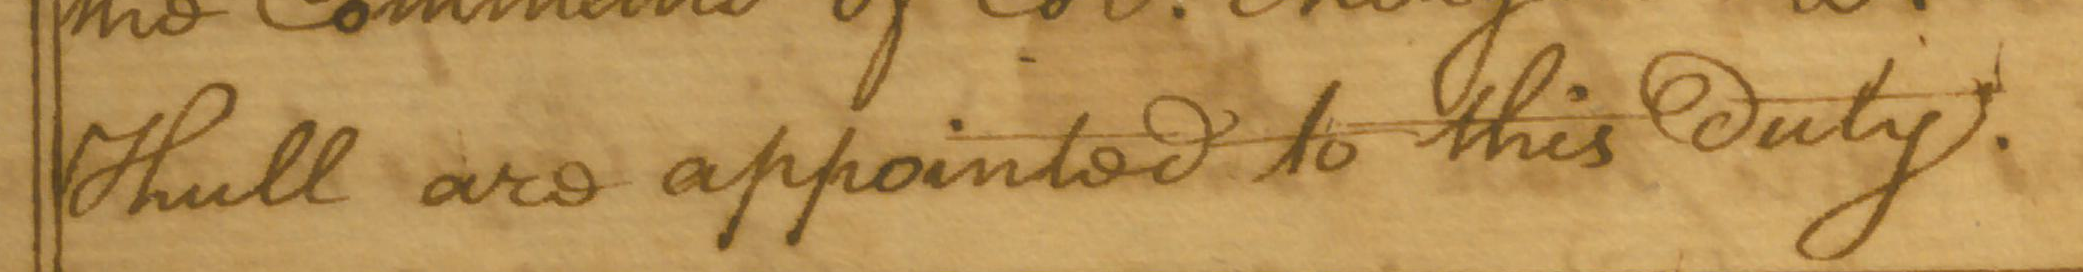Hull are appointed to this duty.
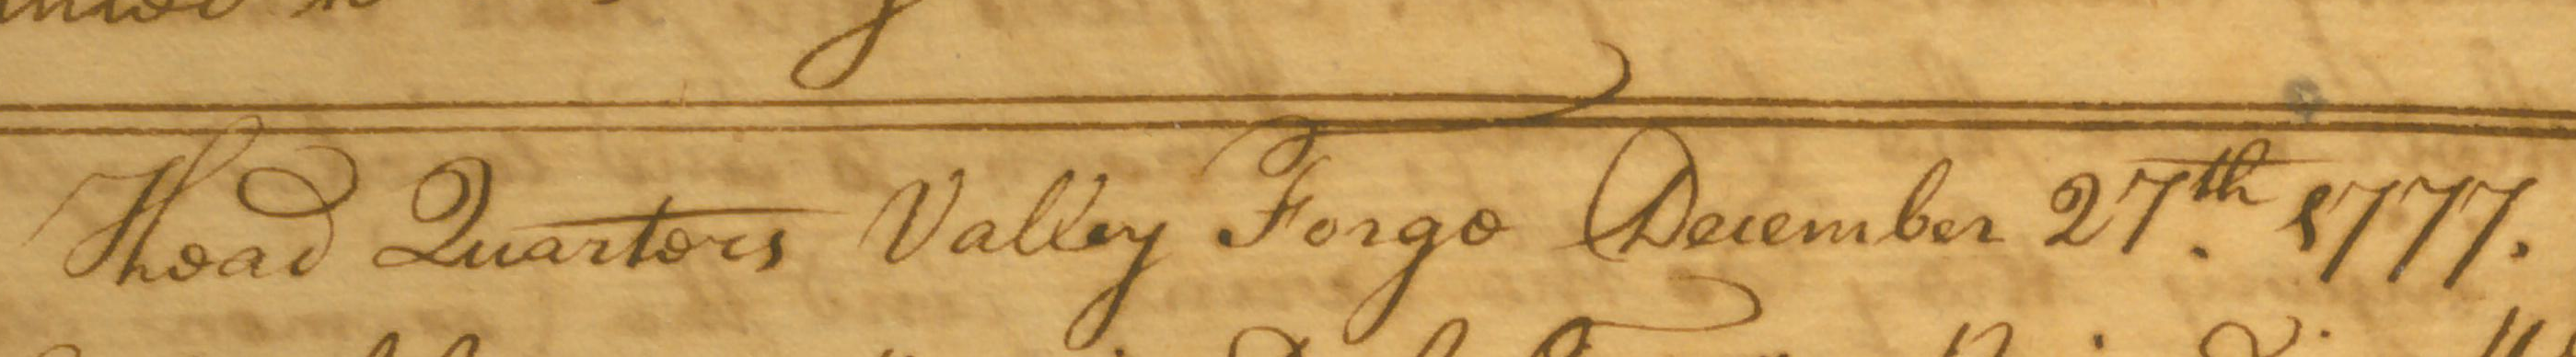Head Quarters Valley Forge December 27^th. 1777.
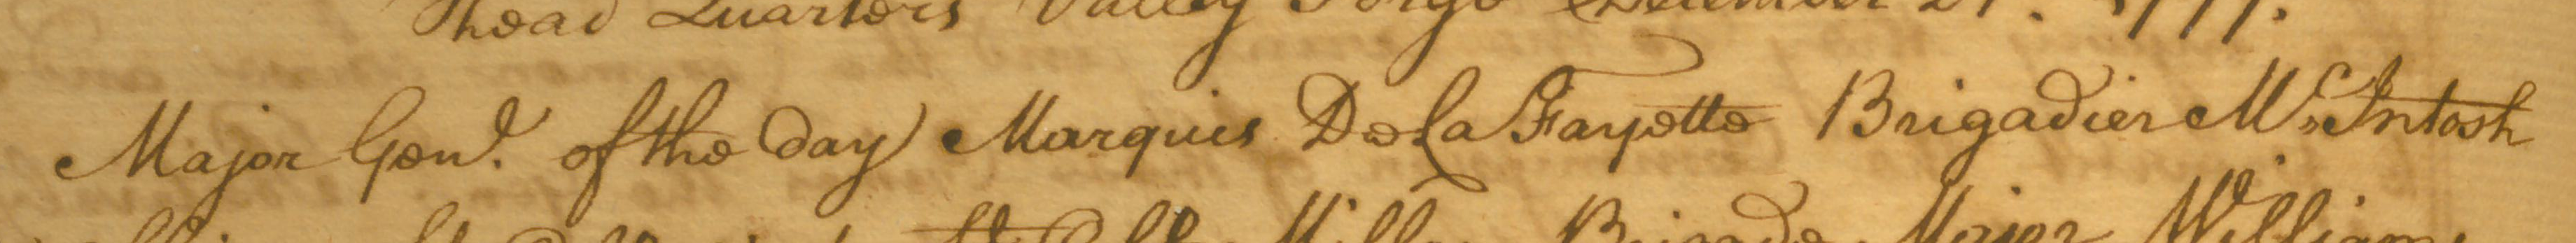Major Gen^l. of the day Marquis De La Fayette Brigadier M^c.Intosh
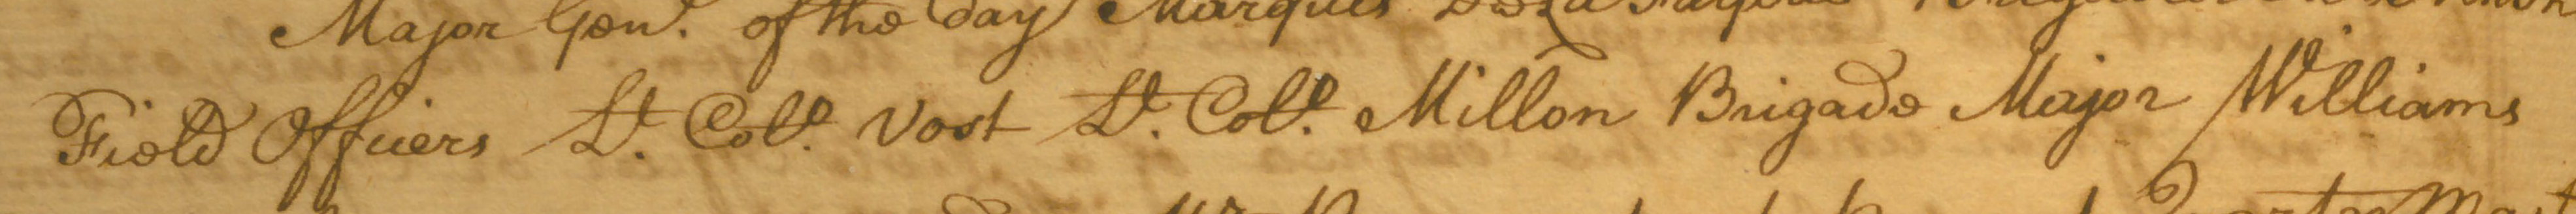Field Officers L^t. Col^o. Vost L^t. Col^o. Millon Brigade Major Williams
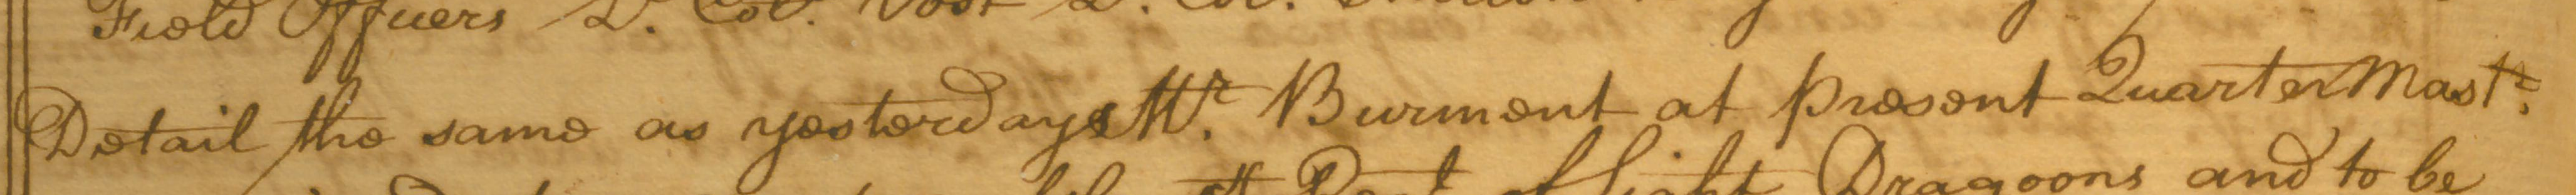Detail the same as yesterday M^r. Burment at present Quarter Mast^r.
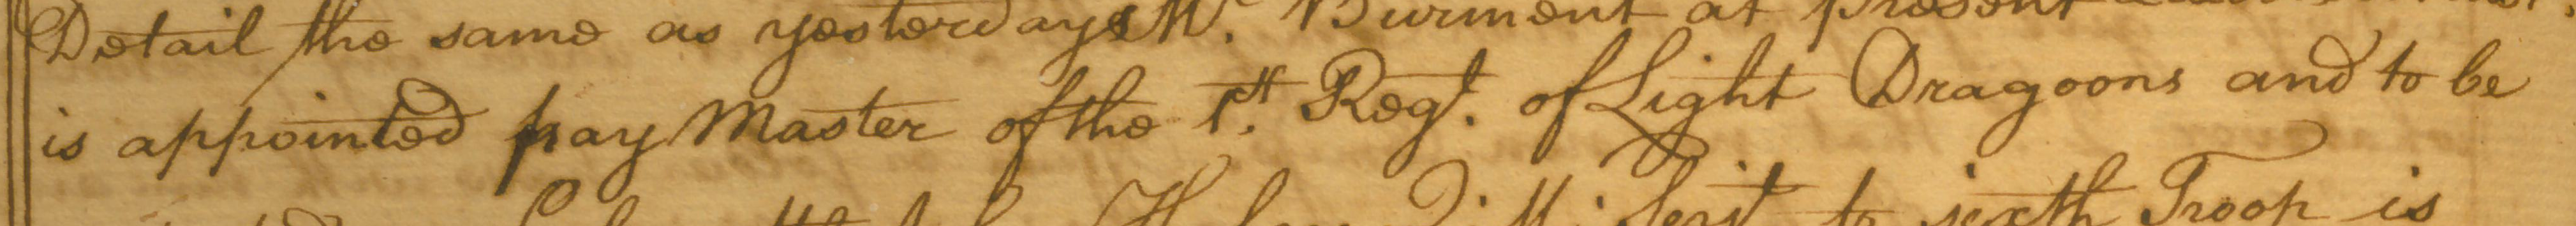is appointed pay master of the 1^st. Reg^t. of Light Dragoons and to be
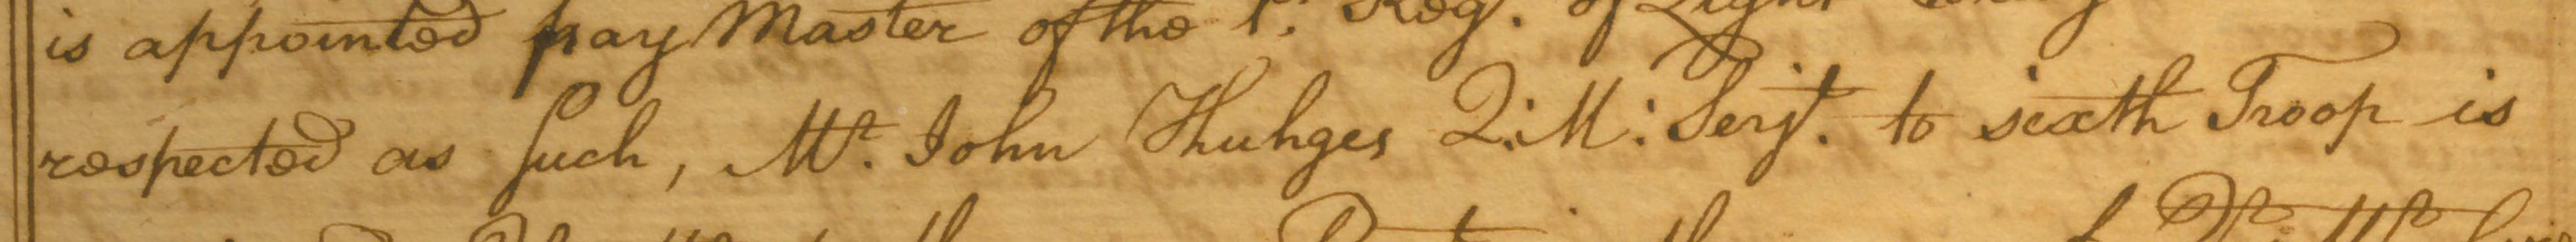respected as such, M^r. John Hughes Q:M:Serj^t. to sixth Troop is
